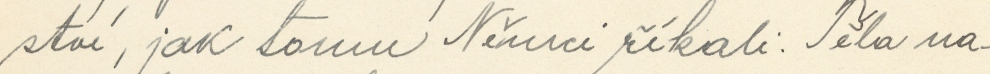ství, jak tomu Němci říkali. Těla na-
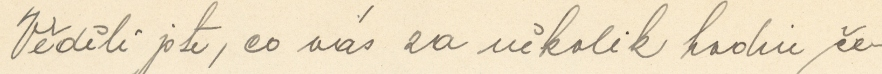Věděli jste, co vás za několik hodin če-
